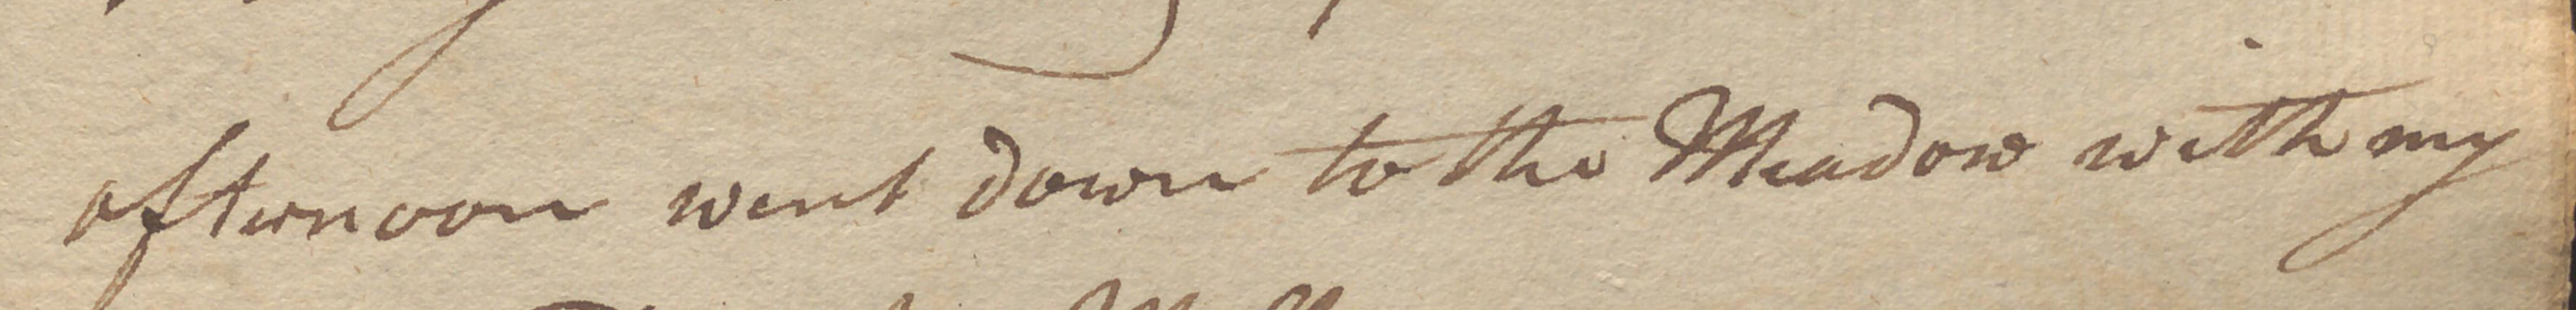afternoon went down to the Meadow with my
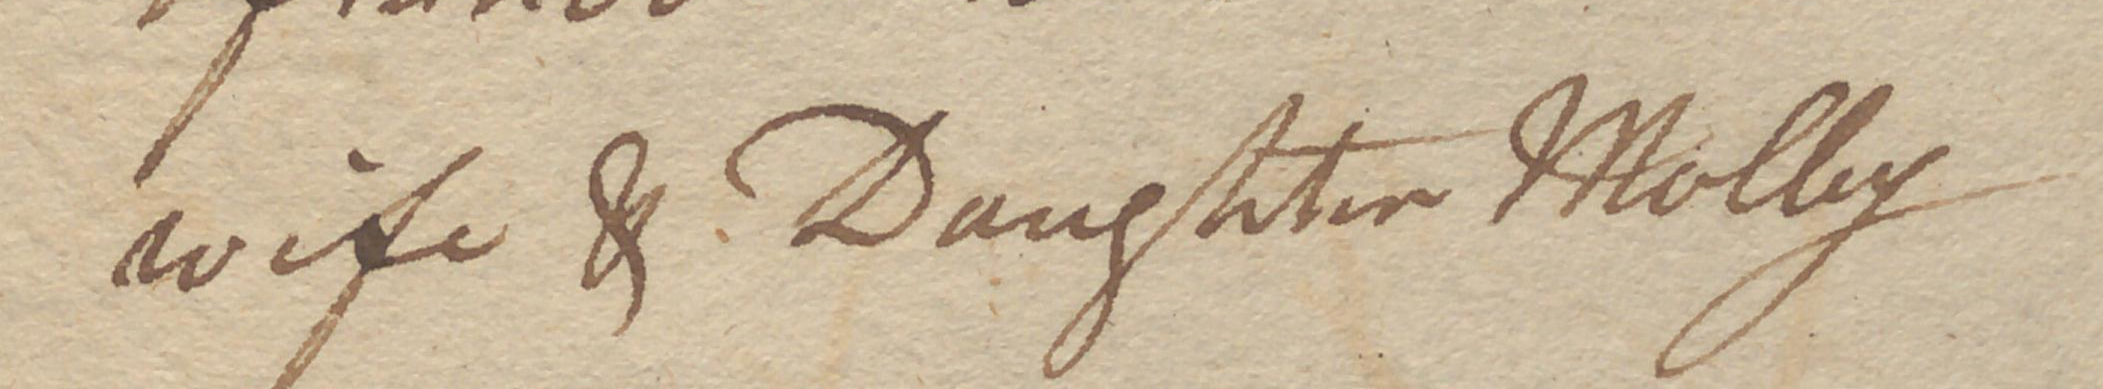wife & Daughter Molly
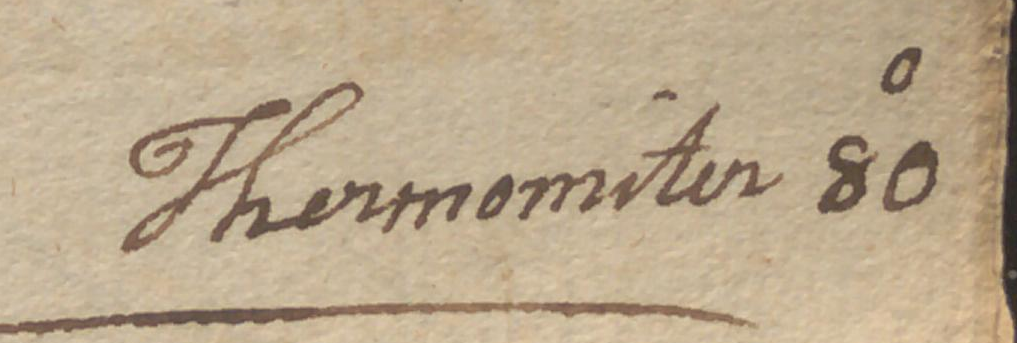Thermomiter 80°
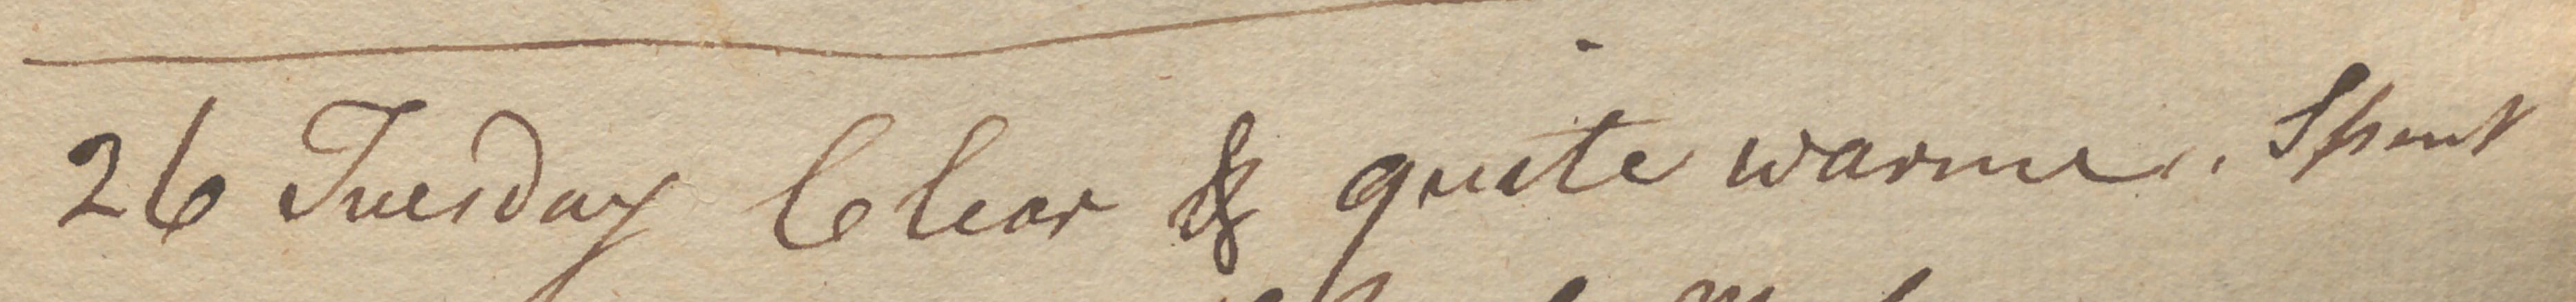26 Tuesday Clear & quite warme. spent
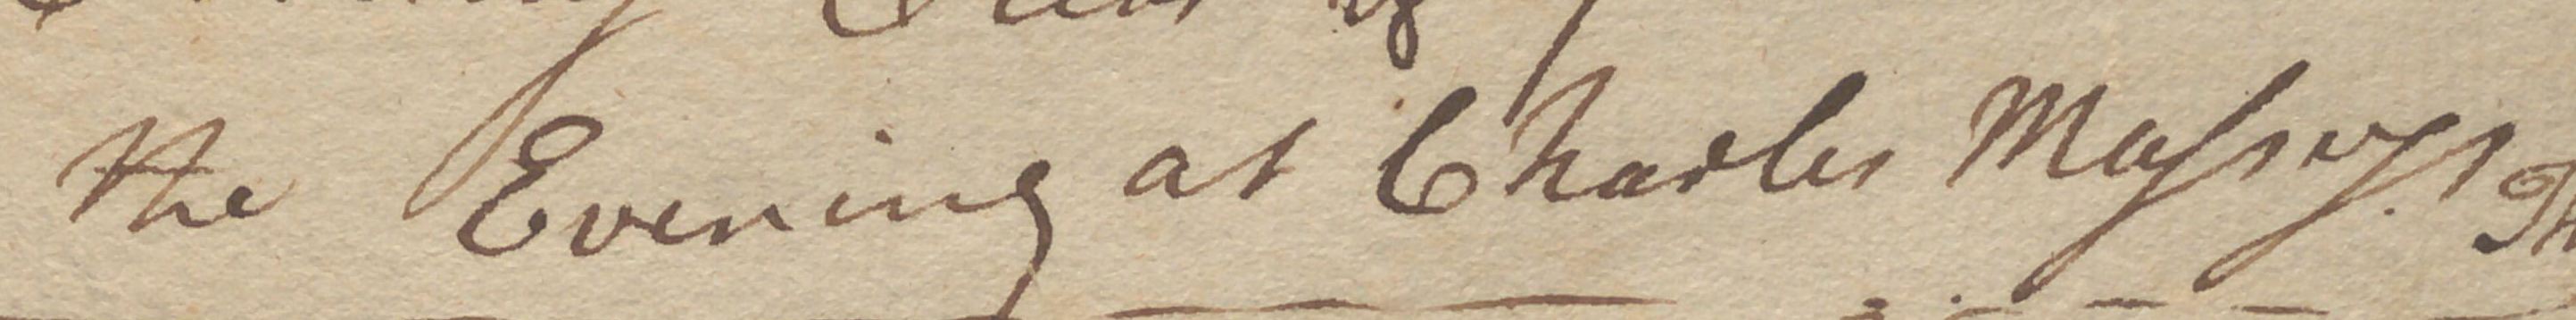the Evening at Charles Masseys
